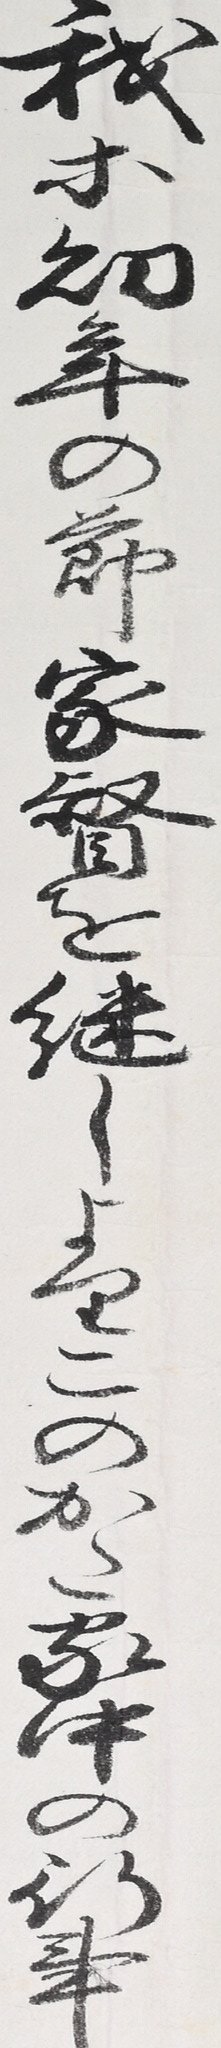我等幼年の節家督を継しよりこのかた家中の行事
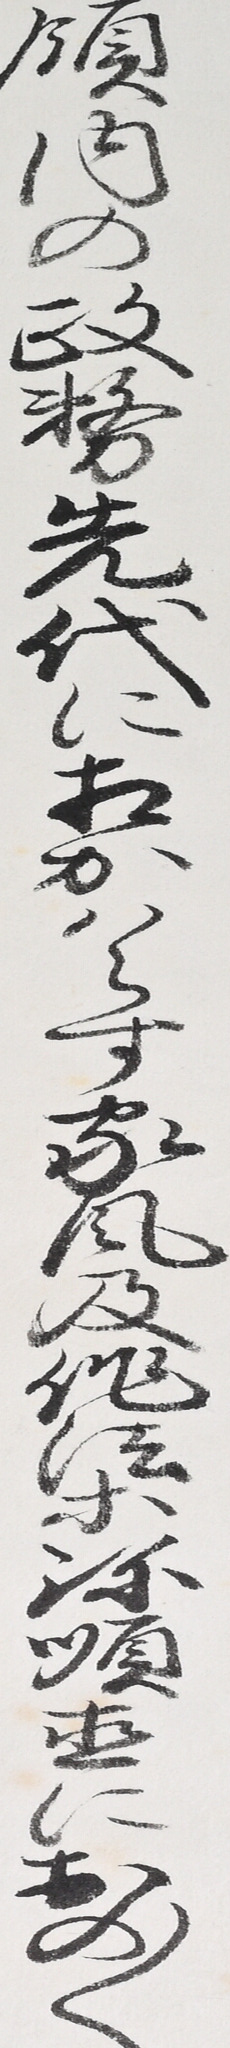領内の政務先代に相かハらす家風及作法等弥順直におの〳〵
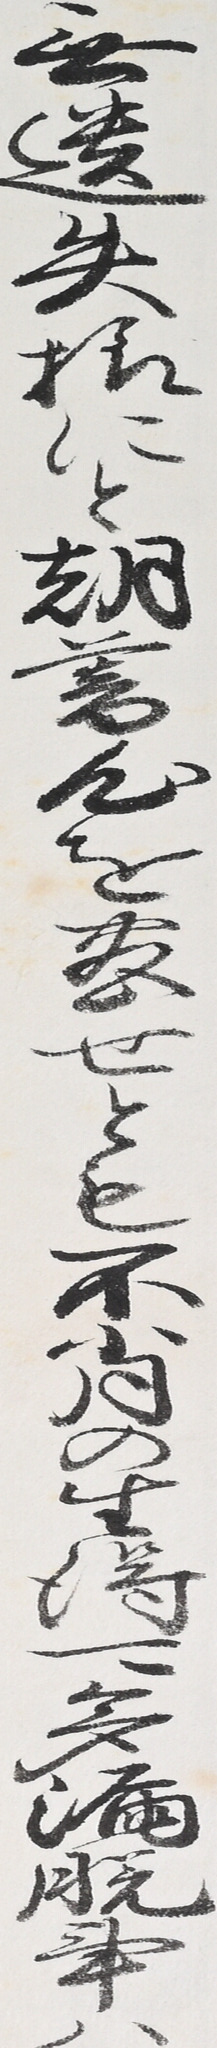無遺失様にと朝暮心を尽せとも不肖の生得可多漏脱事ハ
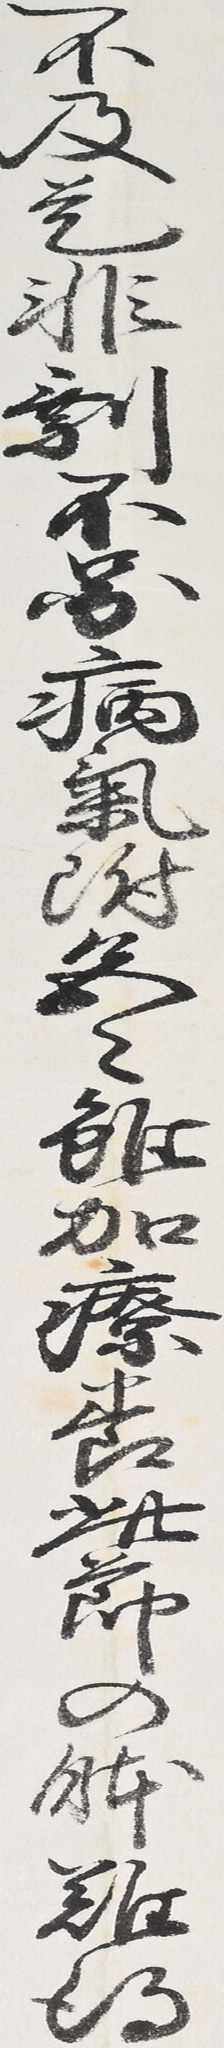不及是非剰不図病気附色々雖加療養此節の躰難得
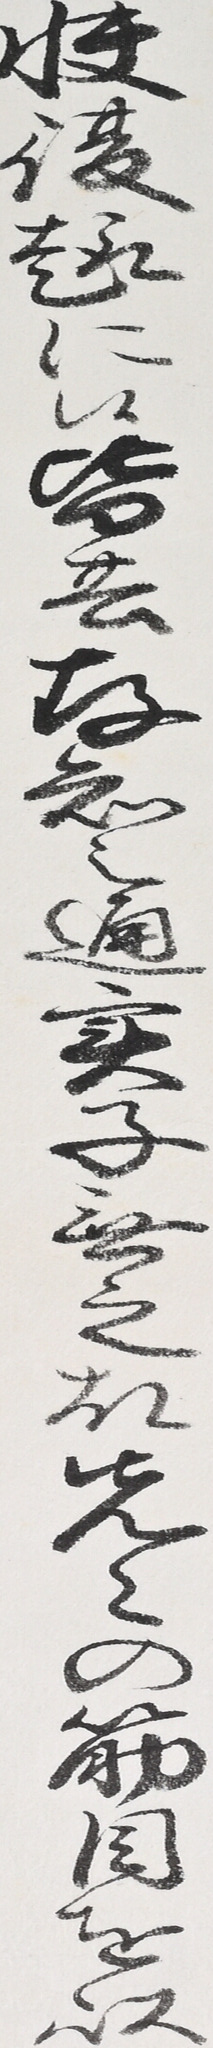快復趣に候皆共存知之通実子無之故先々の筋目を以
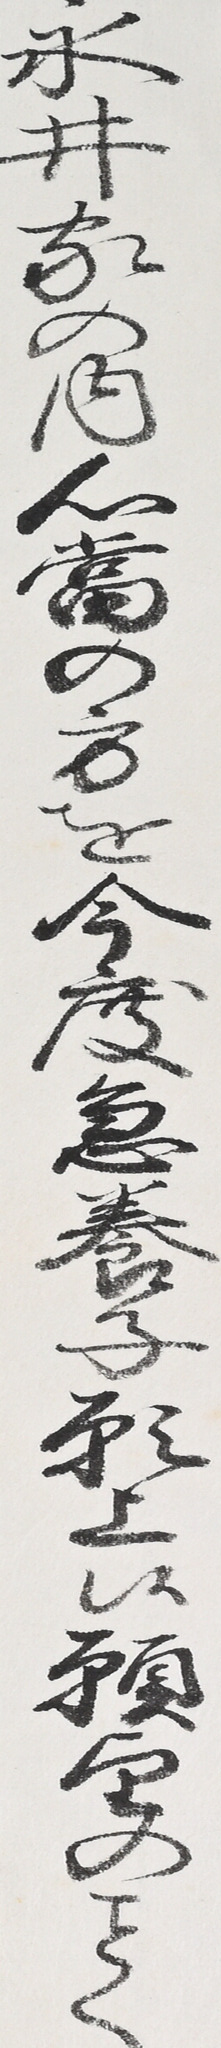永井家の内心当の方を今度急養子願上候願望のことく
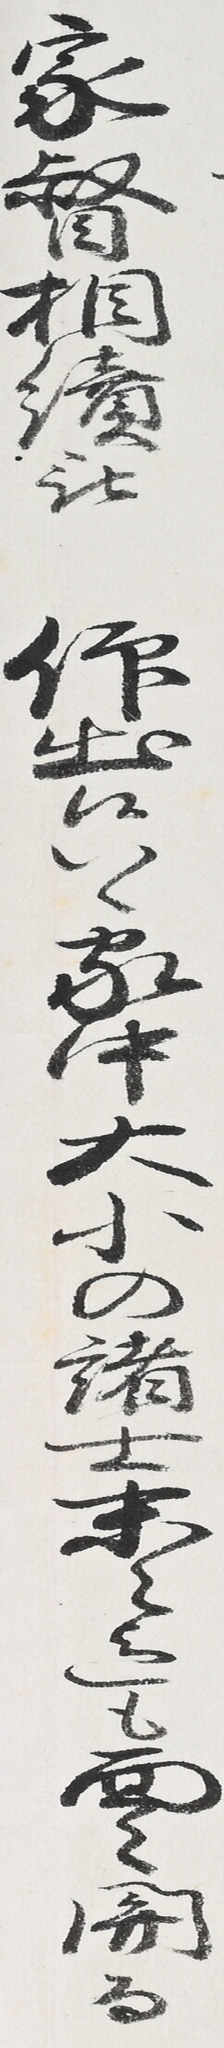家督相続被仰出候ハゝ家中大小の諸士末々迄も面々開る
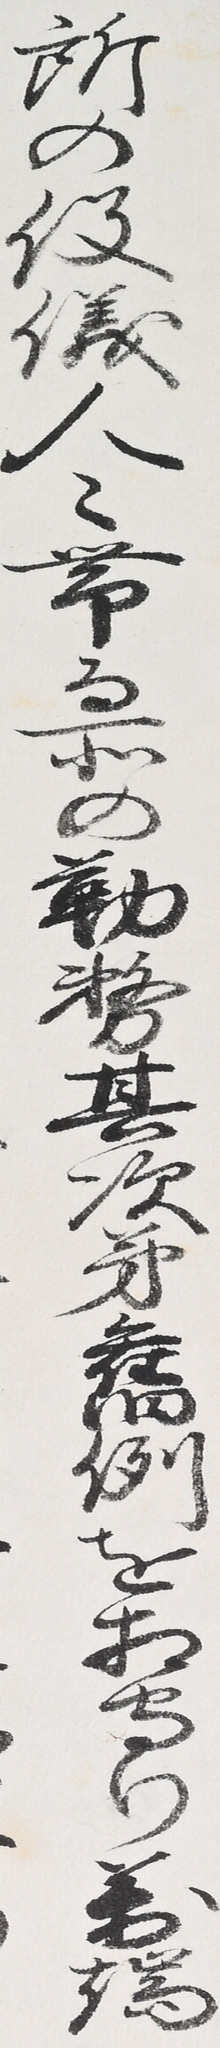所の役儀人々帯る所の勤務其次第旧例を相守り万端
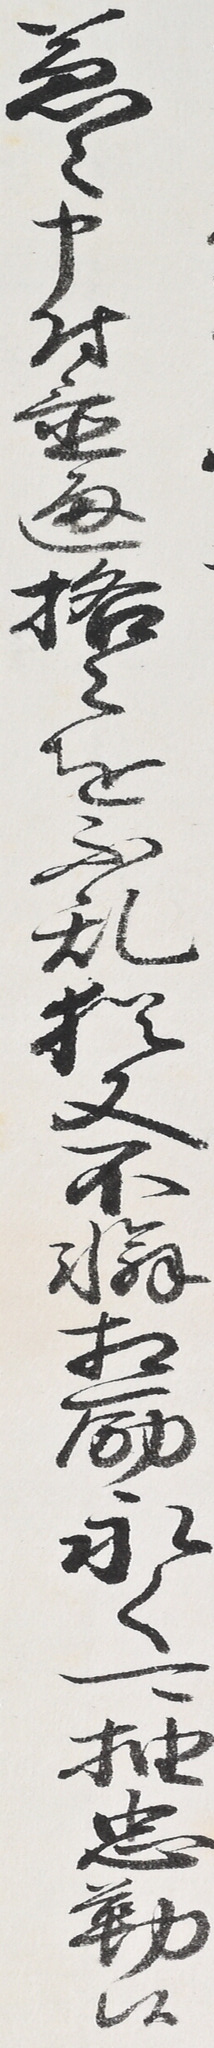兼々申付置通格々を不乱猶又不懈相励永く可抽忠勤候
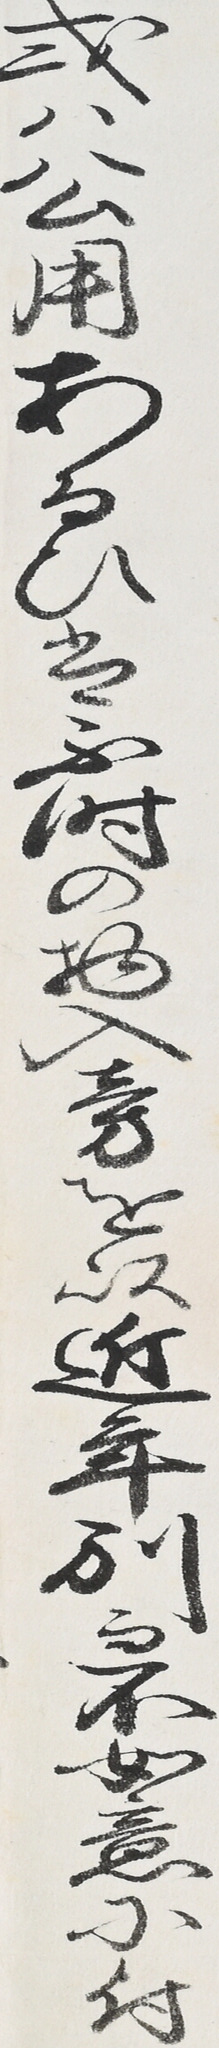或ハ公用あるひは不時の物入旁を以近年別而不如意に付
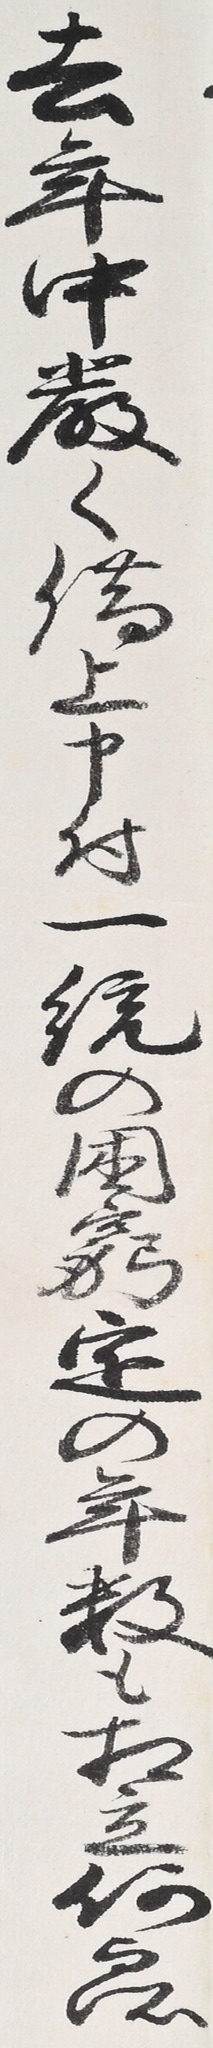去年中厳く借上申付一統の困窮定の年数も相立何而所
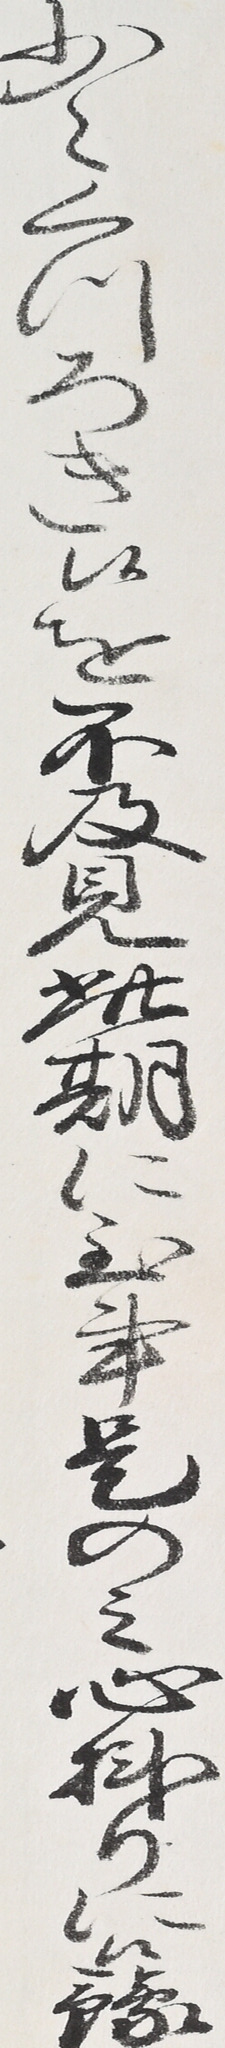少々くつろき候を不及見此期に至事是のミ心掛りに候予
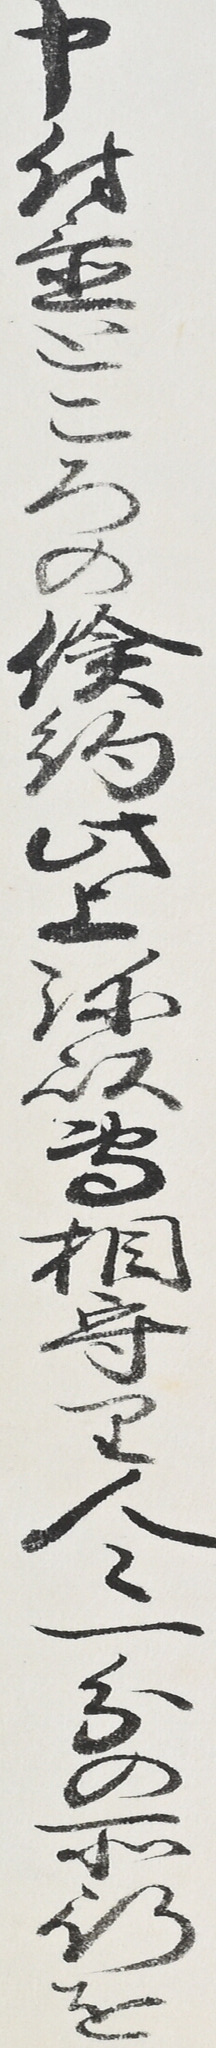申付置ところの倹約此上弥以専相守り人々一分の所行を
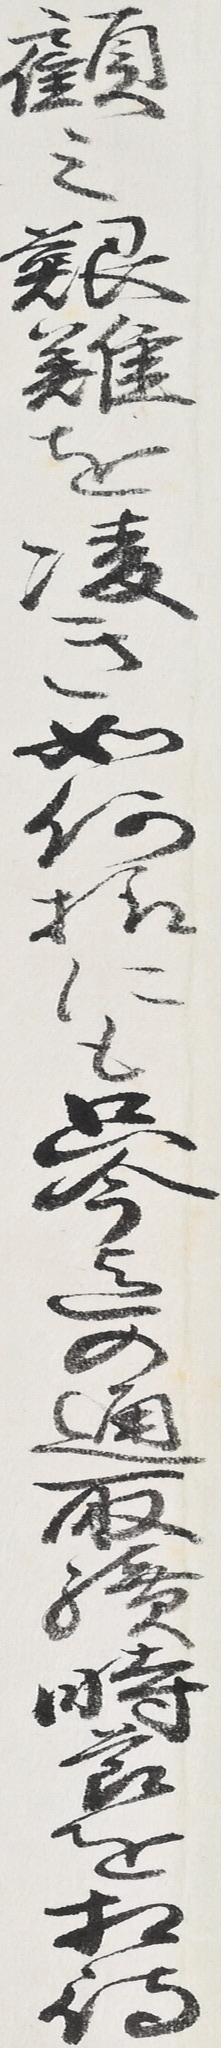顧ミ艱難を凌き如何様にも只今迄の通取続時節を相待
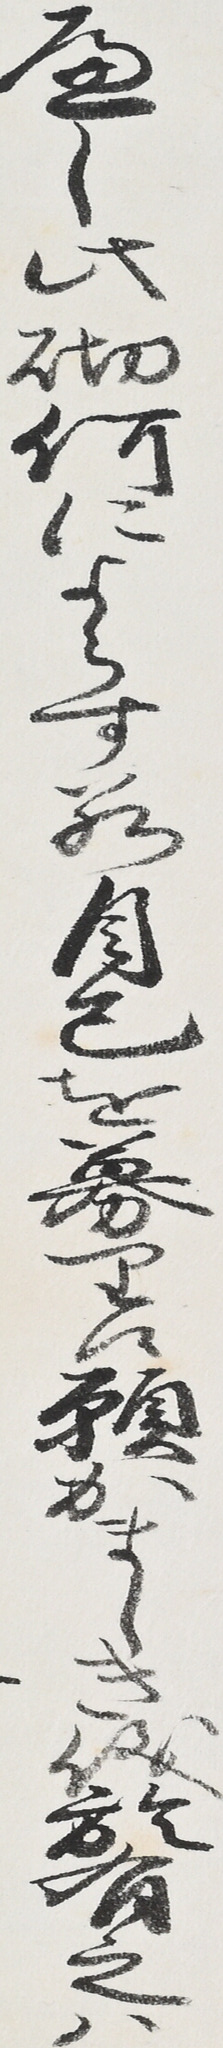へし此砌何によらす若自己を募り候願かましき儀於有之ハ
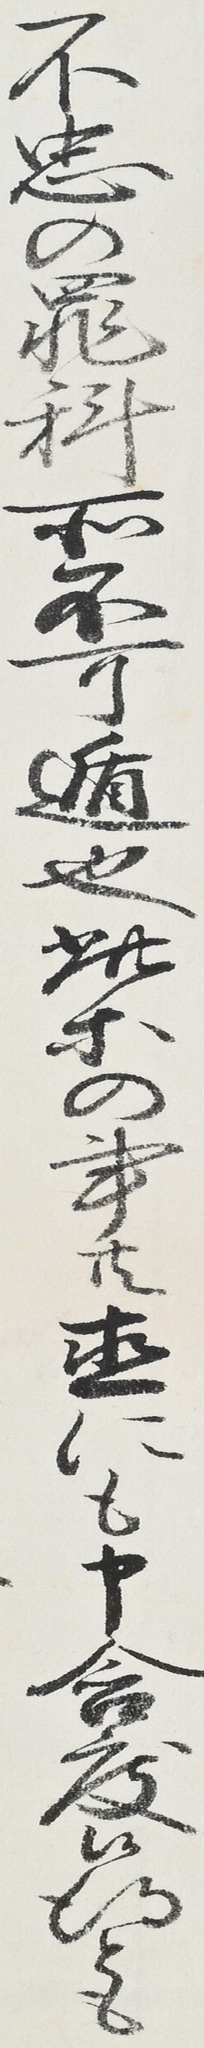不忠の罪科所不可遁也此等の事共直にも申含度候得とも
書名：御遺言〔写共二通一括〕
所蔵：伊那市立高遠町図書館・合同会社AMANE
